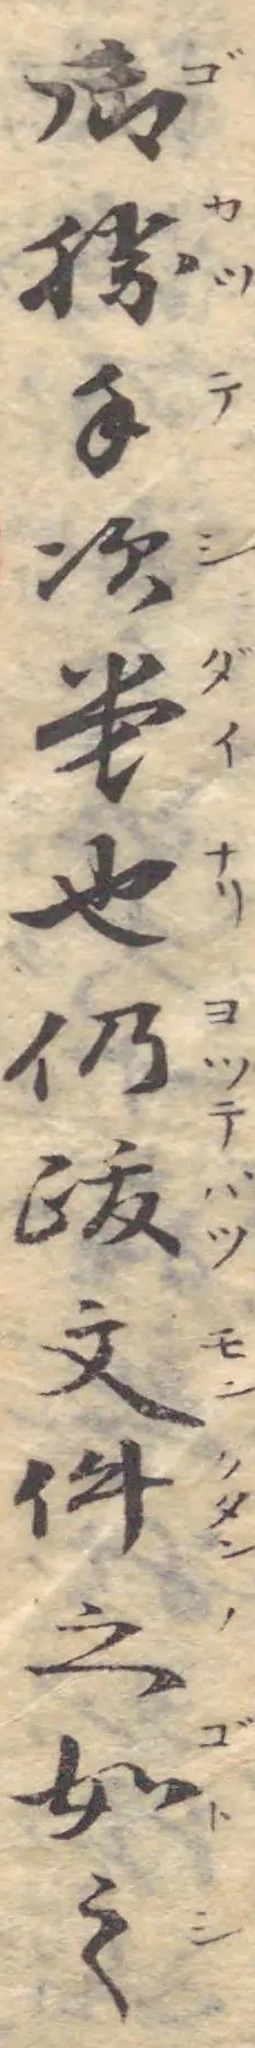御勝手次第也仍跋文件之如之
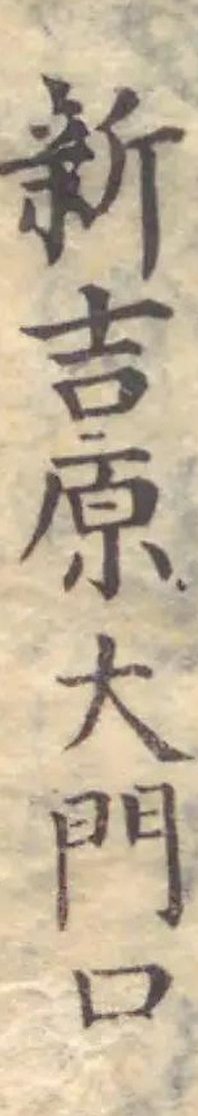新吉原大門口
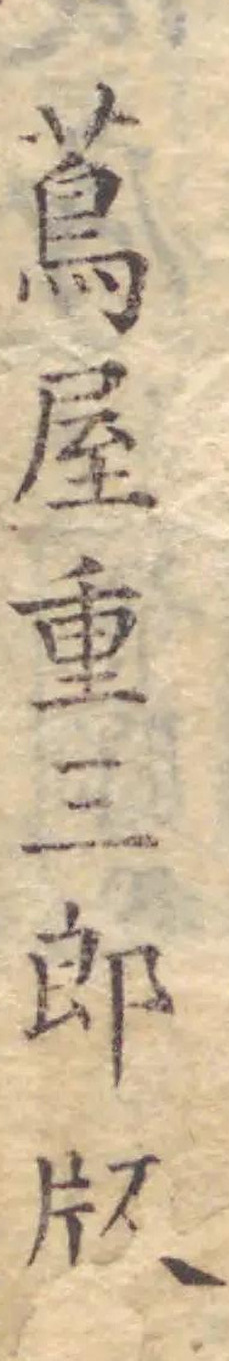蔦屋重三郎版
